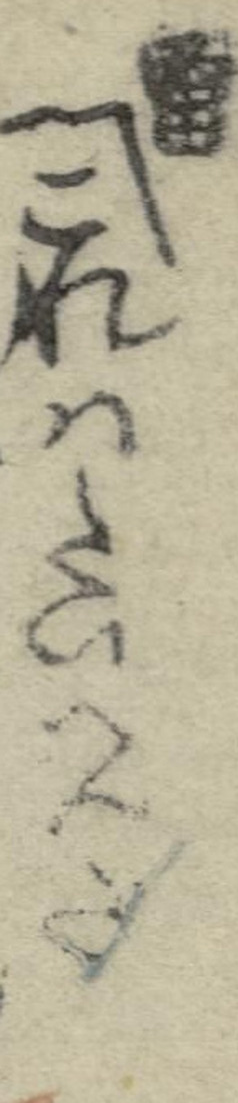〽これはたいへんた
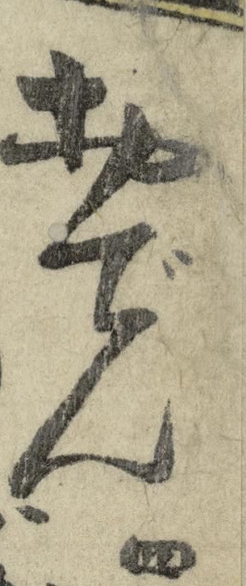おでん
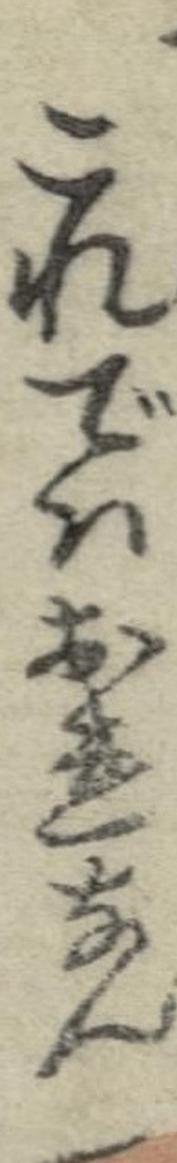これではおれなん
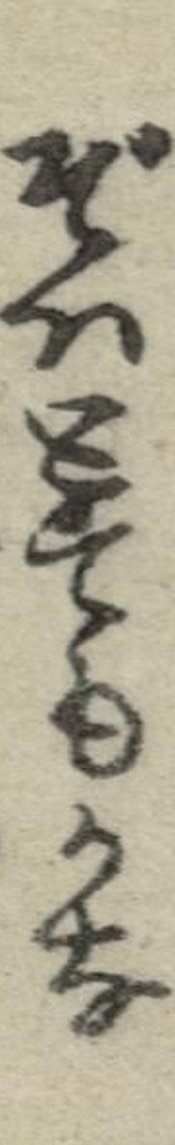ぞはとてもかな
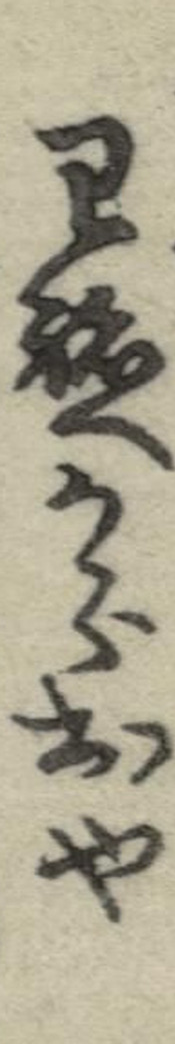わねへからおや
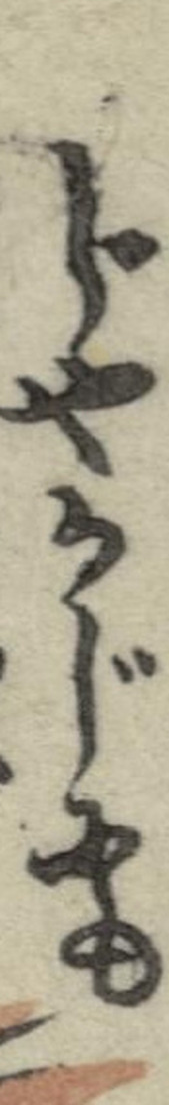じやかじやも
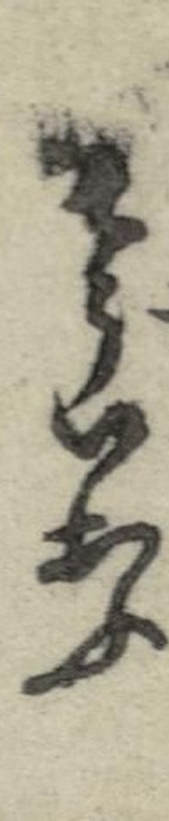わらいあふ
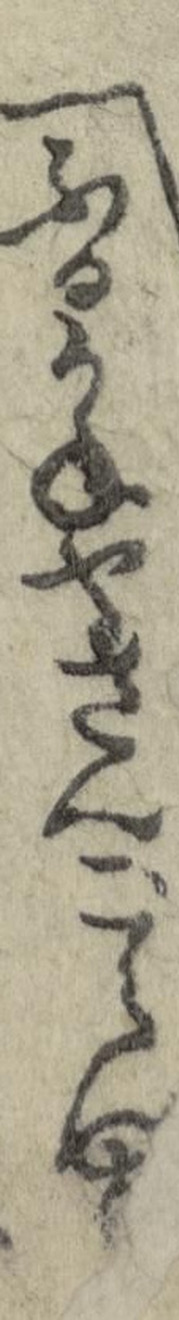〽ふるかねやさんごらんよ
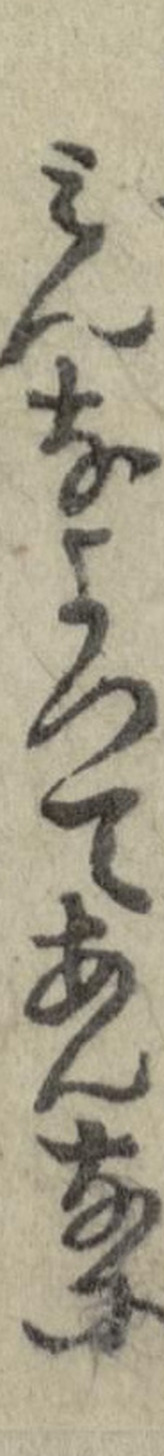みんなよつてあんなに
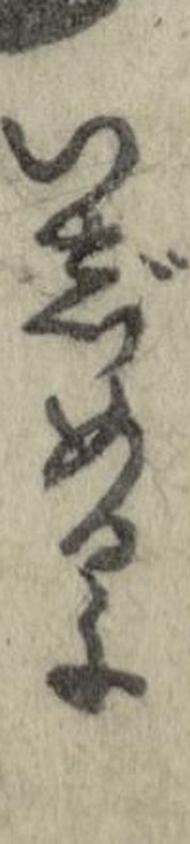いじめるよ
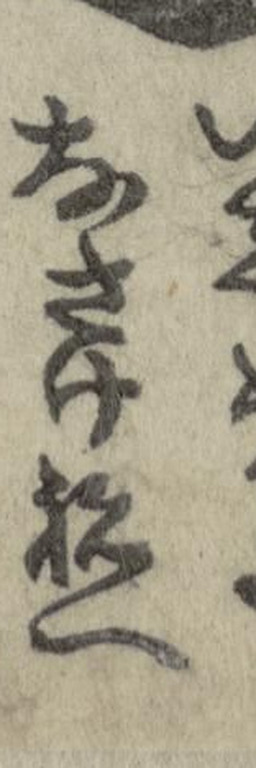なさけねへ
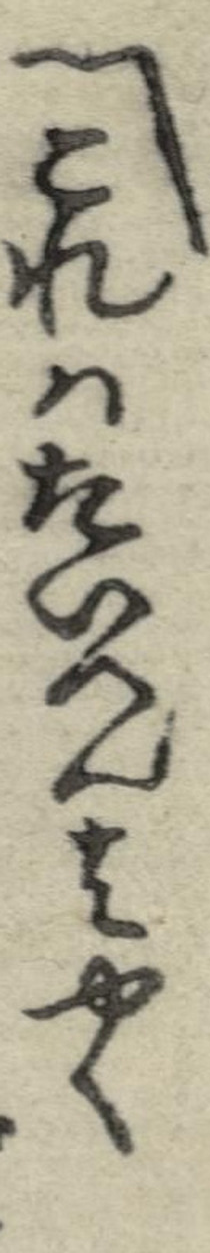〽これはたいへんはやく
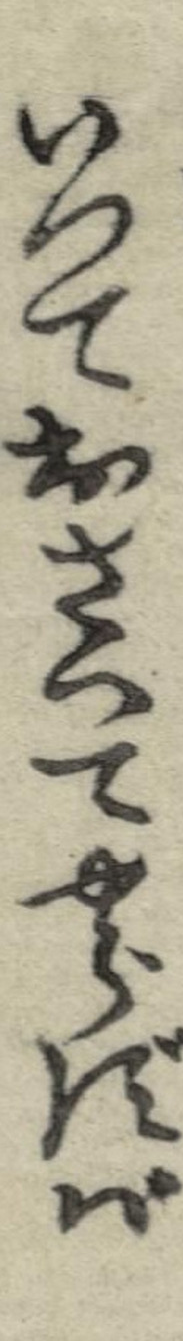いつておさへてやらずば
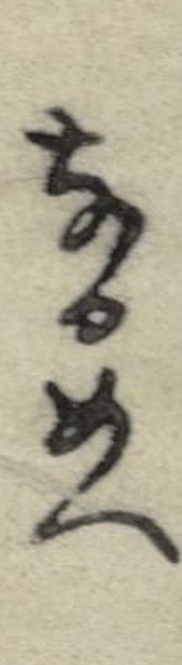なるめへ
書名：[江戸鯰と信州鯰]
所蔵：東京大学地震研究所図書室 Earthquake Research Institute Library, The University of Tokyo, JAPAN
